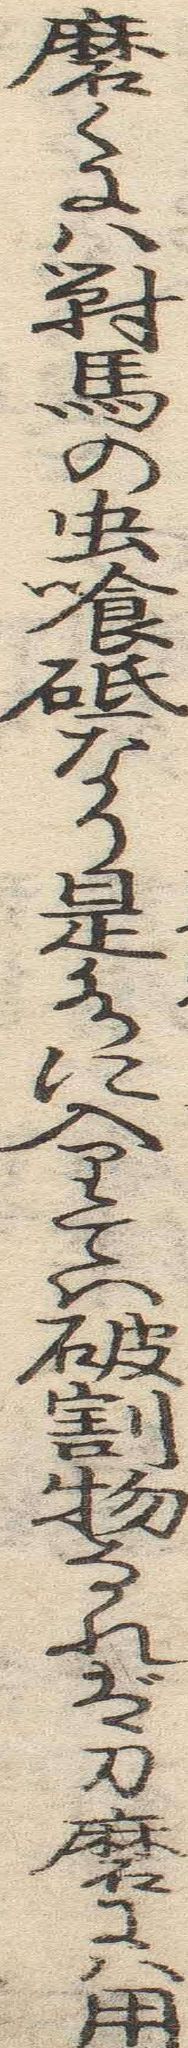磨くには対馬の虫喰砥なり是水に入りては破割物なれば刀磨には用
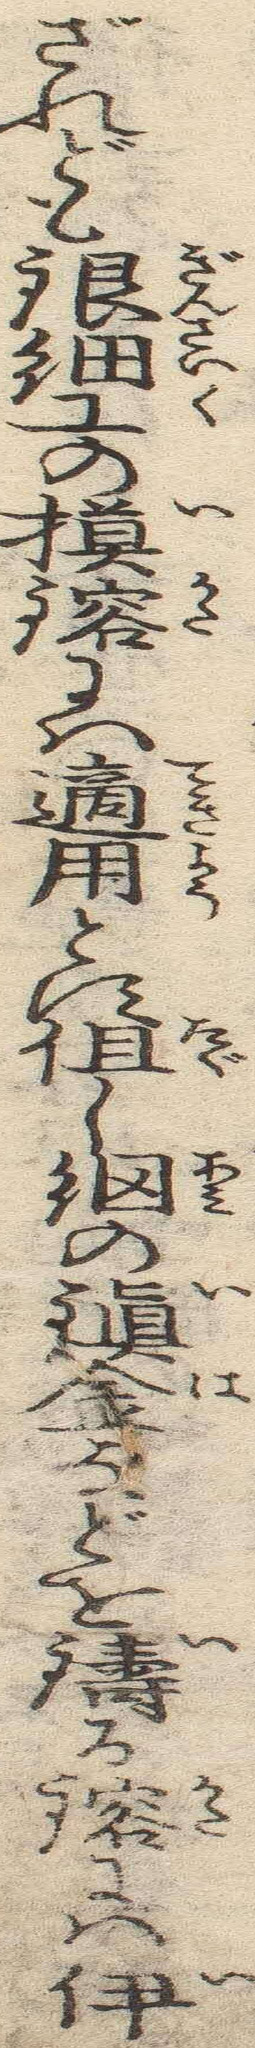ざれども銀細工の模鎔には適用とす但し網の鎮金などを鋳る鎔には伊
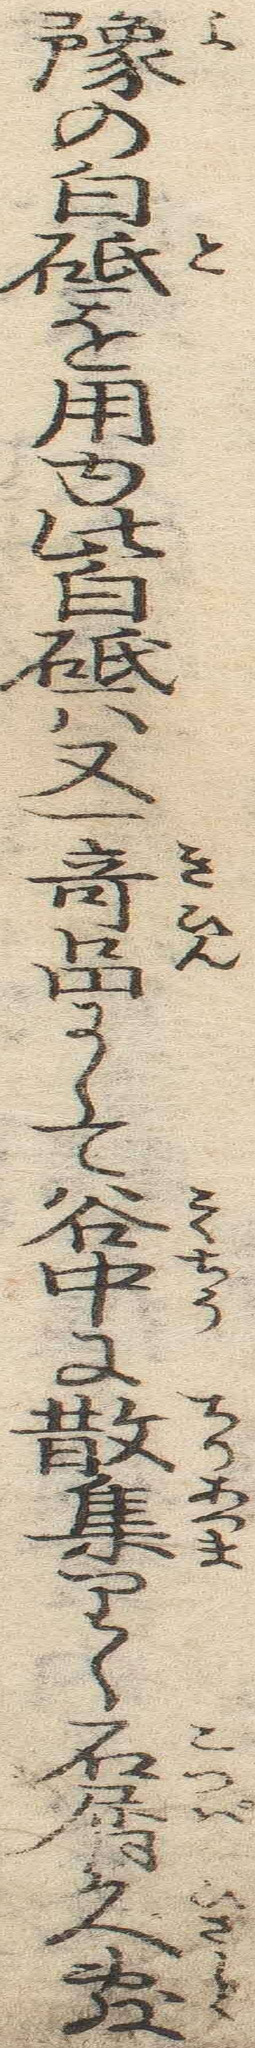予の白砥を用ゆ此白砥は又一奇品にして谷中に散集りし石屑久敷
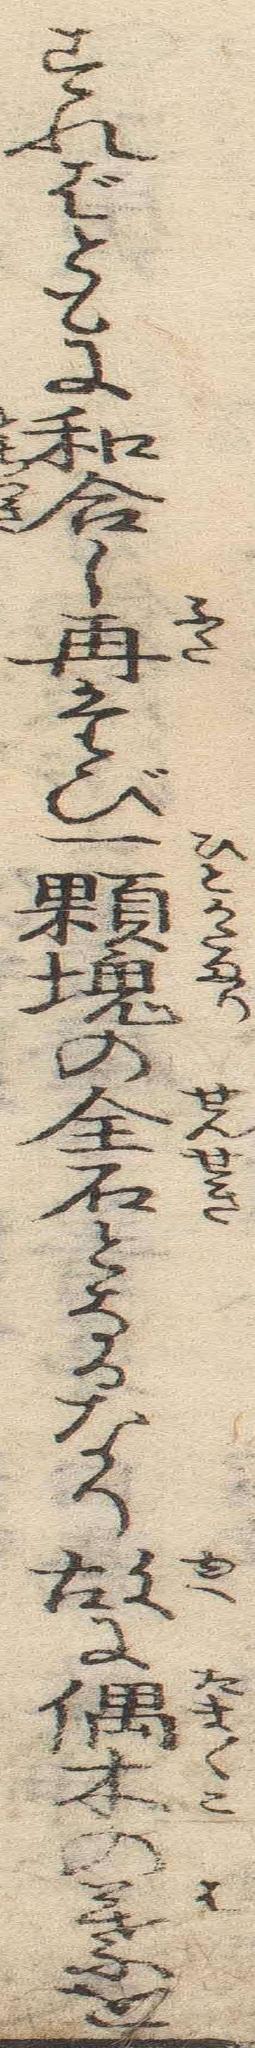すればともに和合し再たび一顆塊の全石となるなり故に偶木の葉を
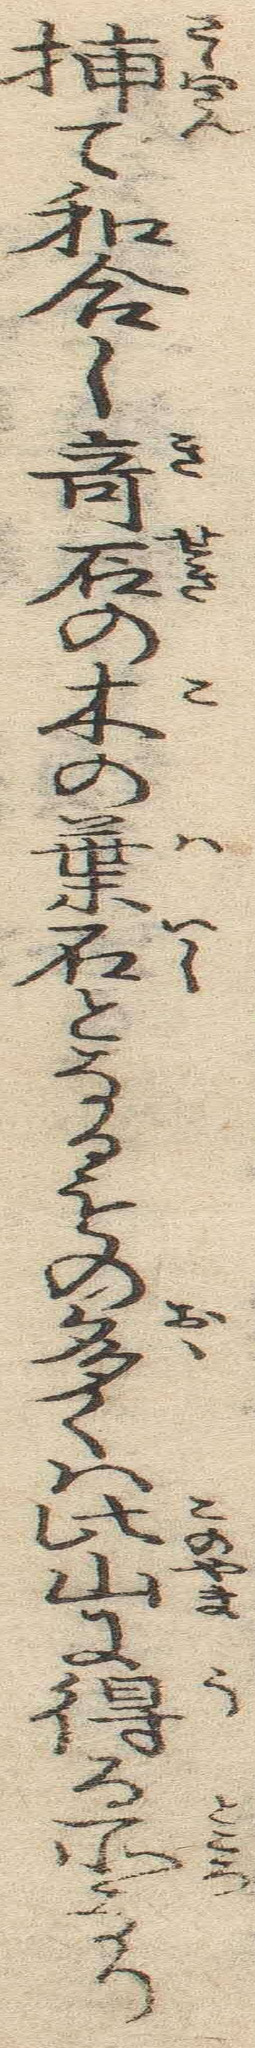挿て和合し奇石の木の葉石となるもの多くは此山に得る所なり
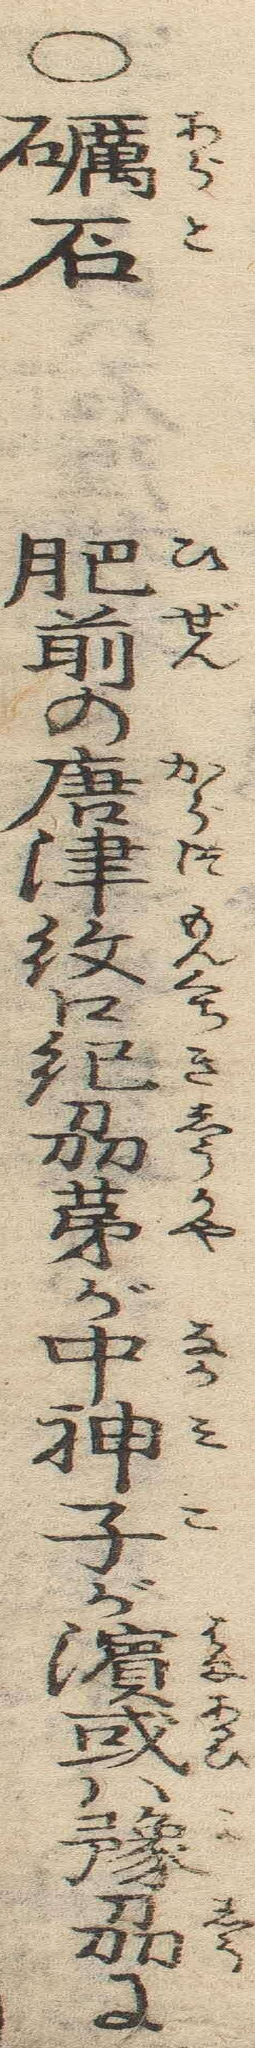○礪石肥前の唐津紋口紀州茅が中神子が浜或は予州に

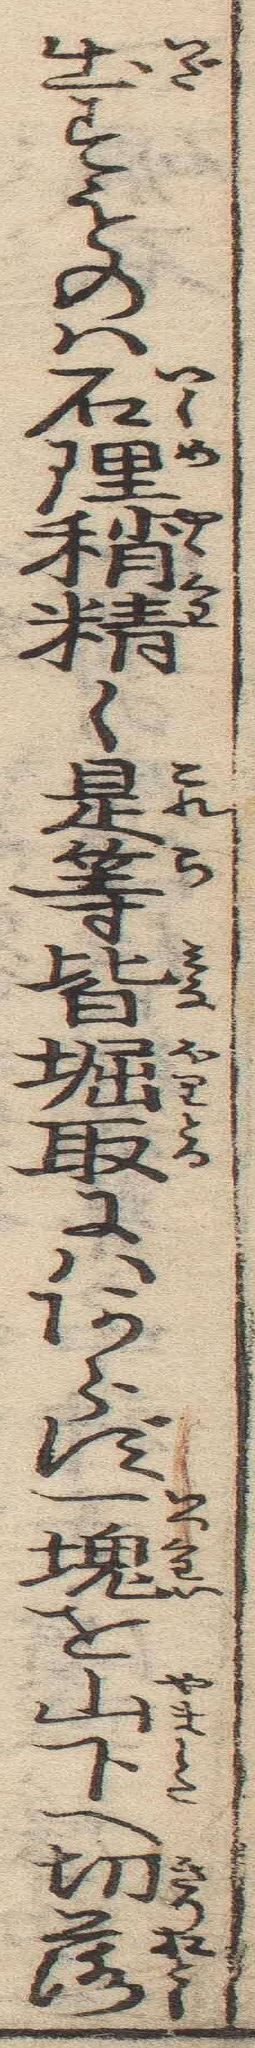出すものは石理稍精し是等皆堀取にはあらず一塊を山下へ切落
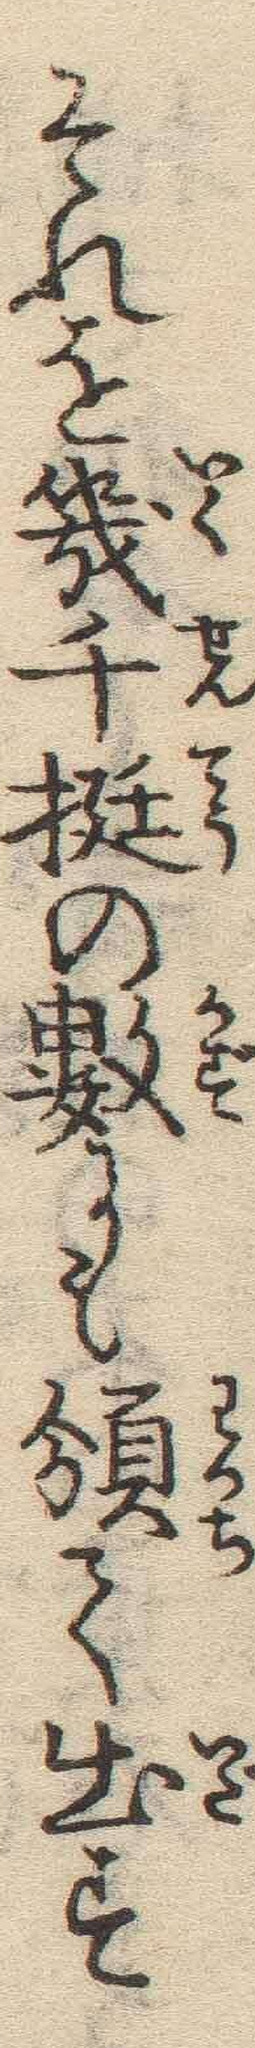それを幾千挺の数にも頒て出す
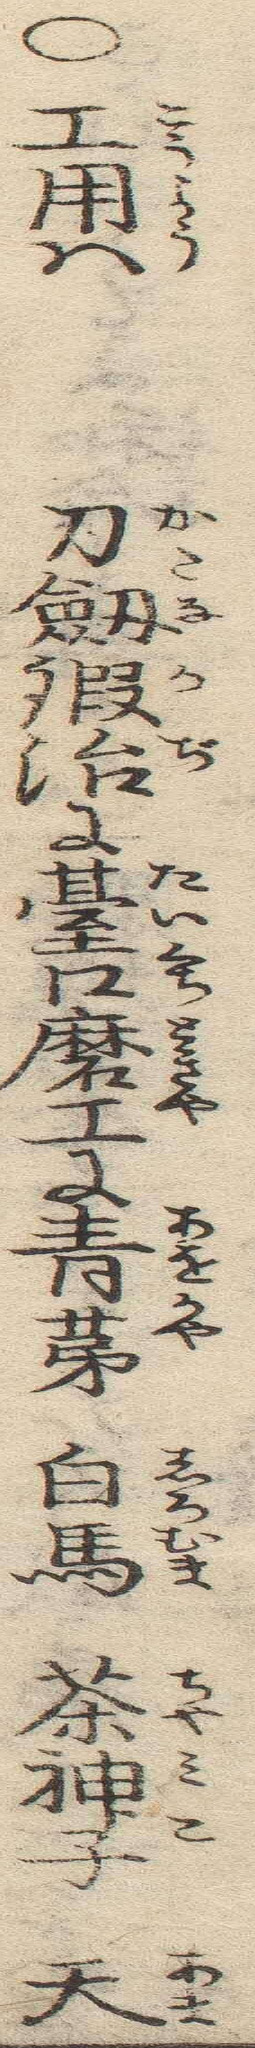○工用は刀剣鍜治に台口磨工に青茅白馬茶神子天
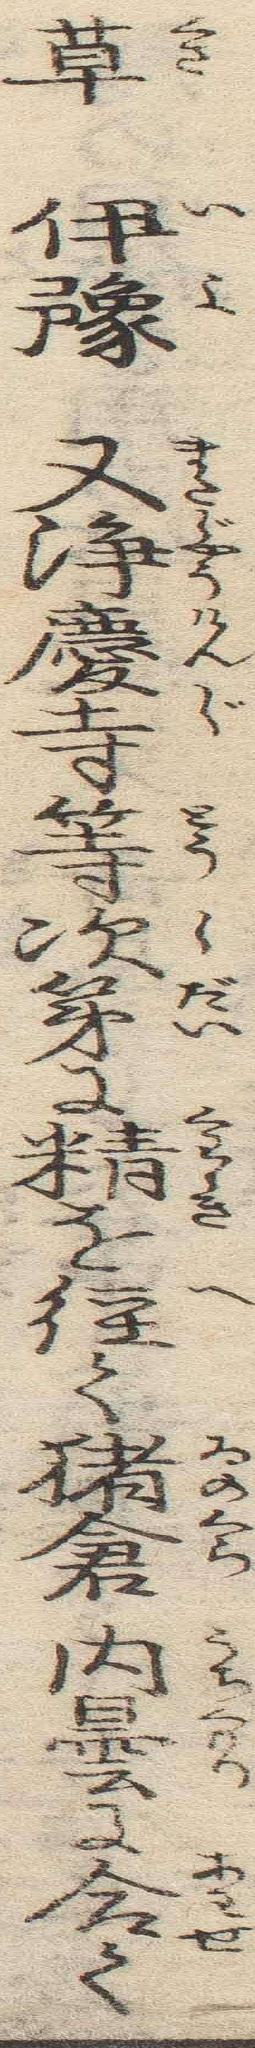草伊予又浄慶寺等次第に精を経て猪倉内曇に合て
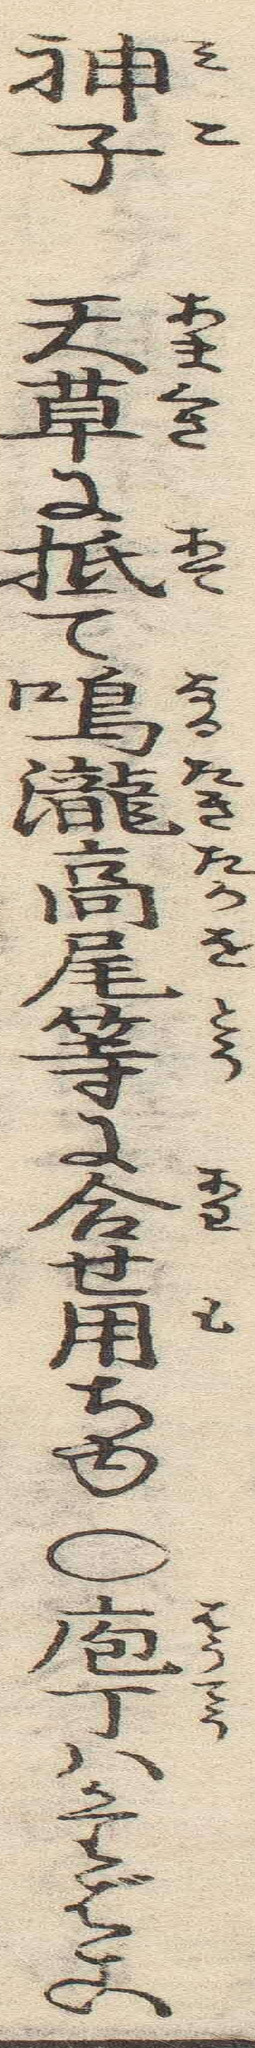神子天草に抵て鳴瀧高尾等に合せ用ちゆ○庖丁はたばこ
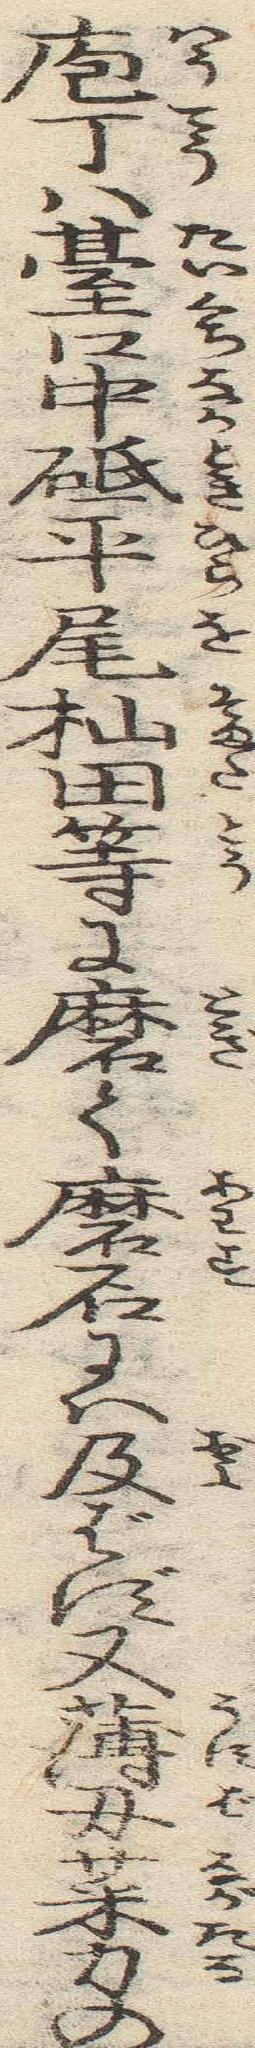庖丁は台口中砥平尾杣田等に磨て磨石には及ばず又薄刃菜刀の
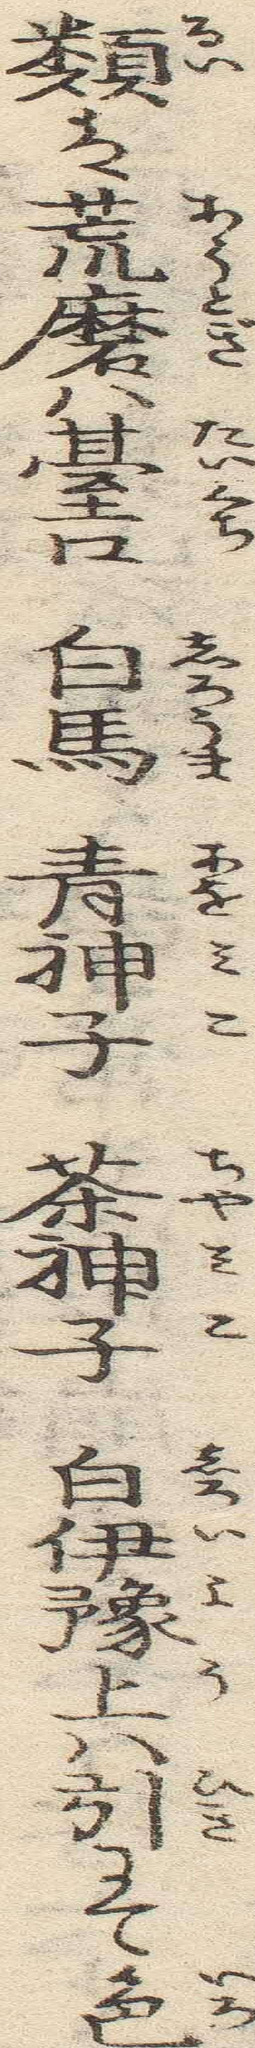類は荒磨は台口白馬青神子茶神子白伊予上は引にて色
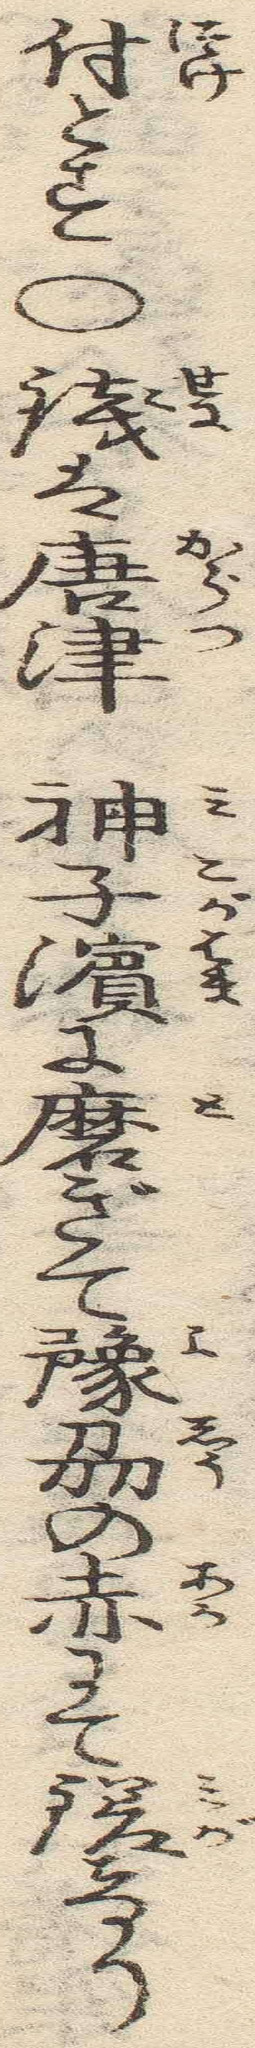付とす○銭は唐津神子浜に磨ぎて予州の赤にて鎈けり
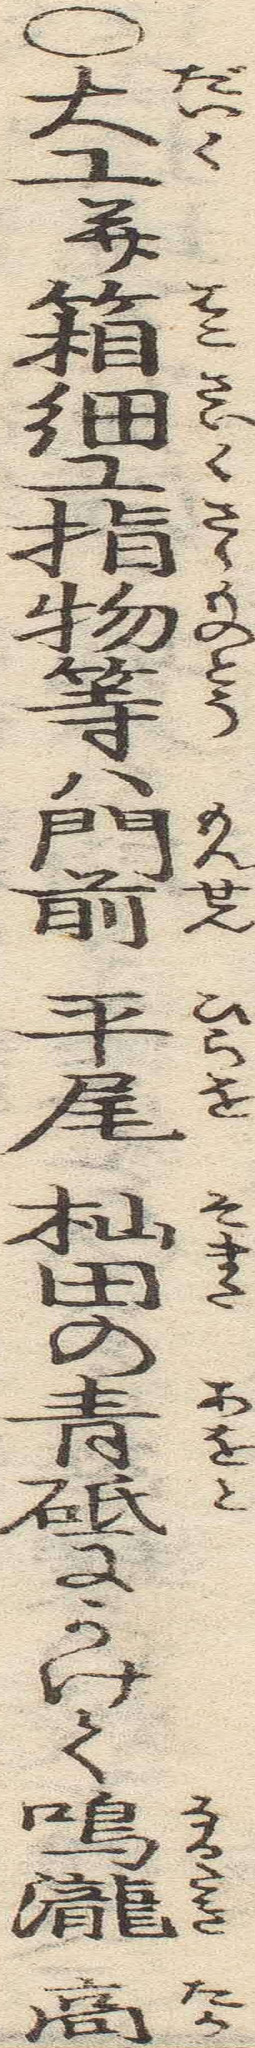○大工并箱細工指物等は門前平尾杣田の青砥にかけて鳴瀧高
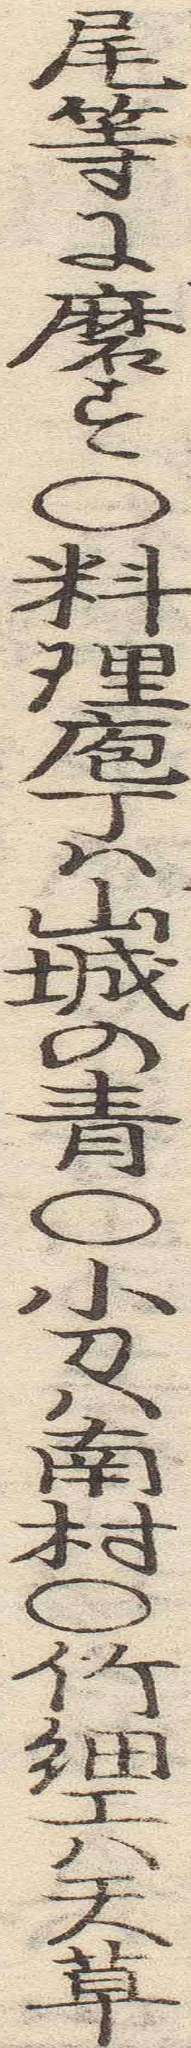尾等に磨す○料理庖丁は山城の青○小刀は南村○竹細工は天草
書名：日本山海名産図会
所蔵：東京学芸大学附属図書館 国文学研究資料館
